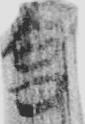宮
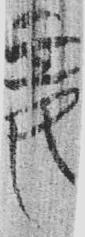妾
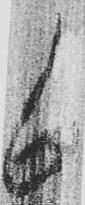㠯（以）
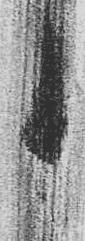十
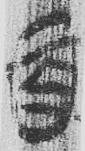百
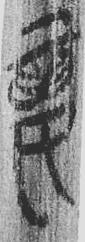數
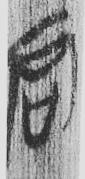君
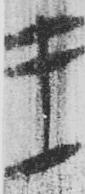王
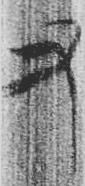又（有）
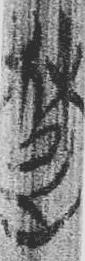楚
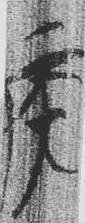侯
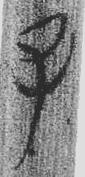子
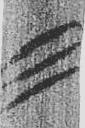三
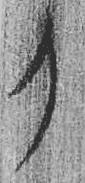人
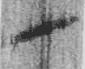一
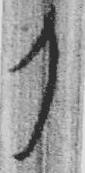人
